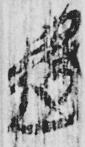○（近）
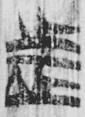者
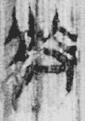敓（悅）
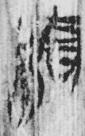紿（治）
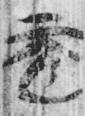而
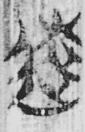遠
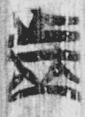者
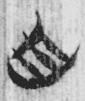自
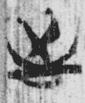至
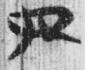四
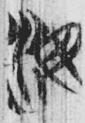○（海）
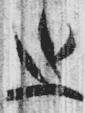之
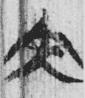內
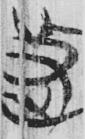及
